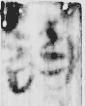既
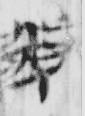發
